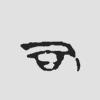司
